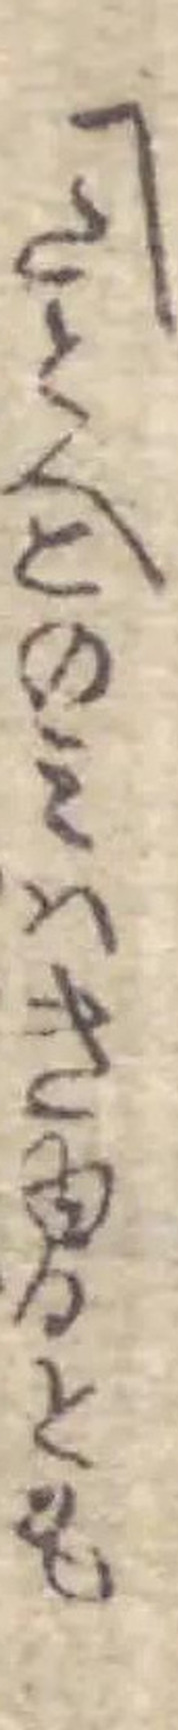〽たとへこのみはきゆるとも
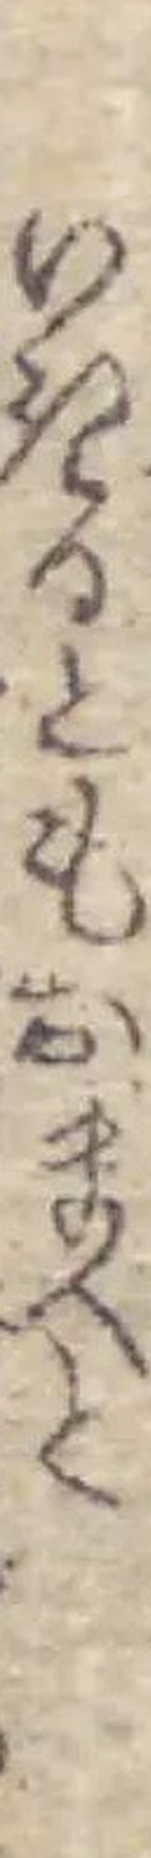いきるともおまへと
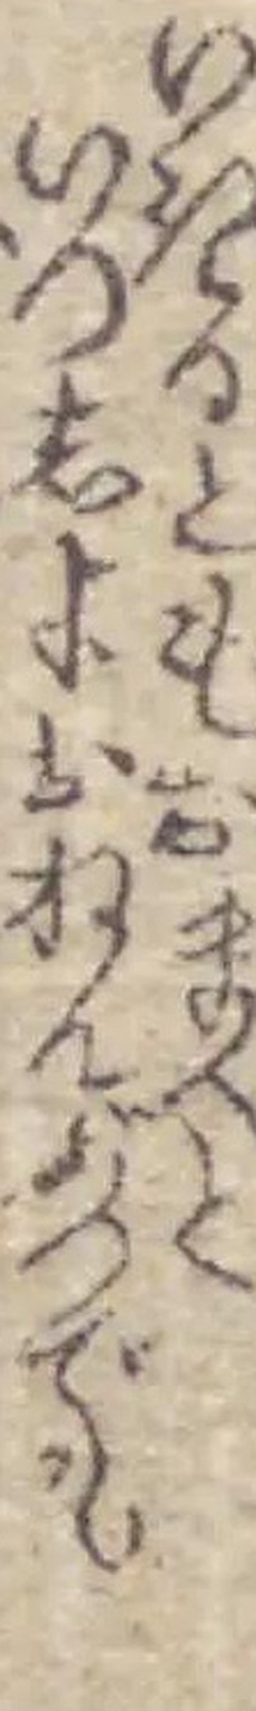いつしよにおねんぶつでも
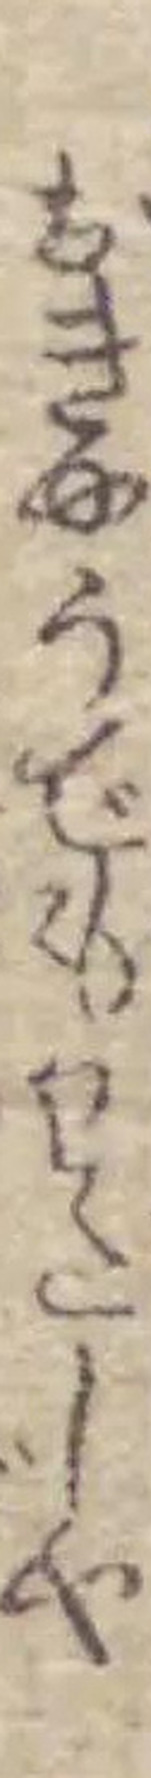おきやうでもわたしや
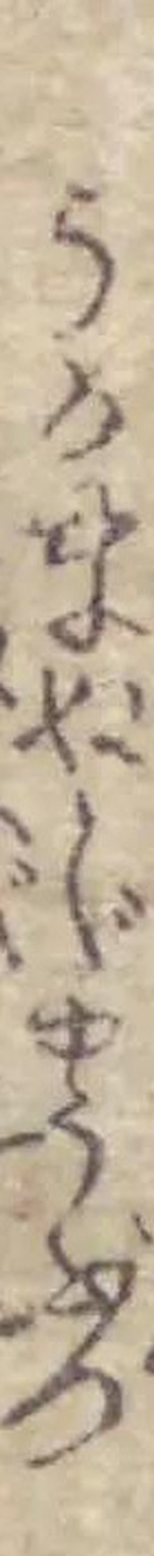うかまぬじやうぶつ
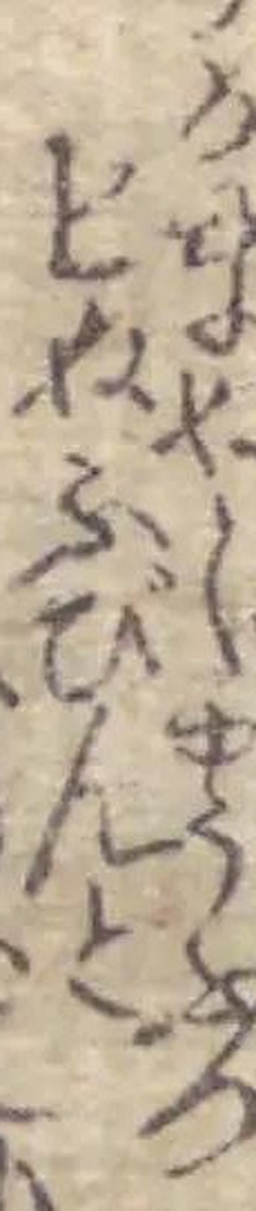せぬふびんと

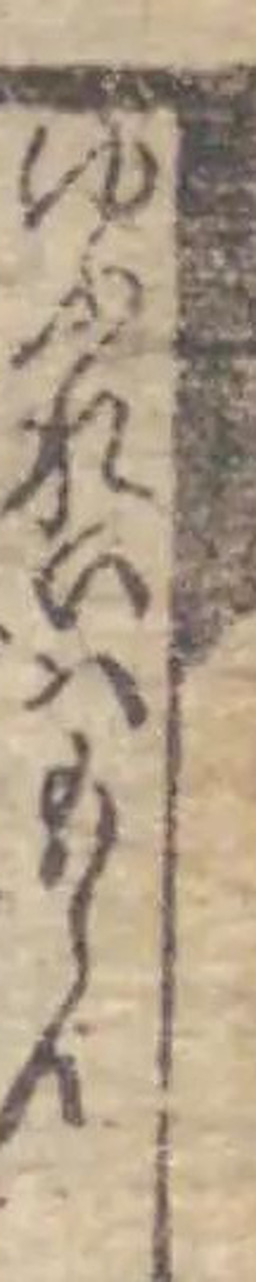ゆふれいはもん
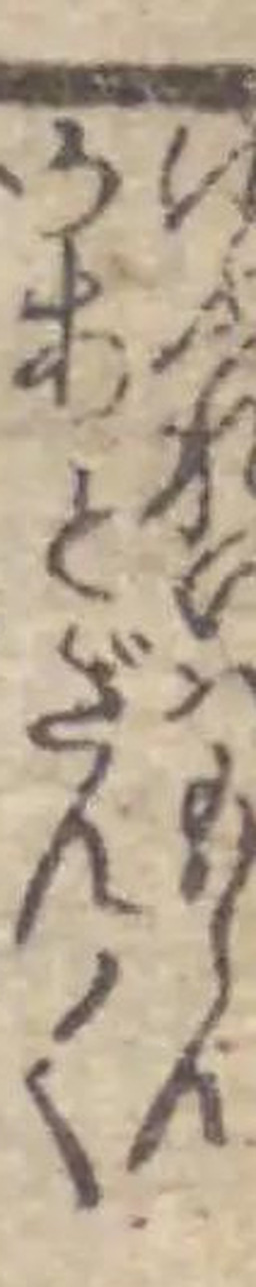かあとだん〳〵
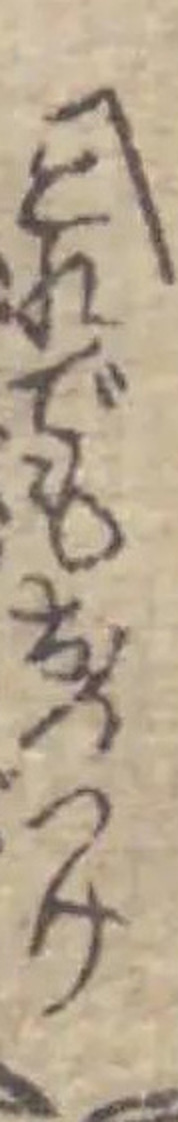〽これでもおつつけ
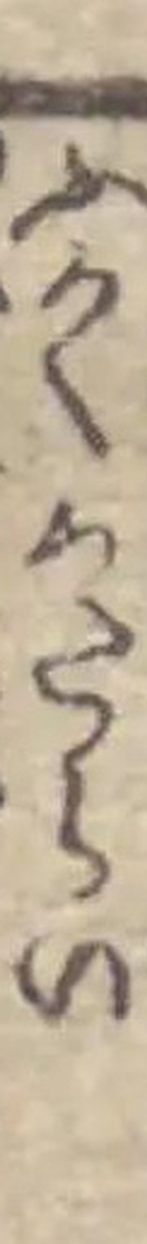ふかくかたらい
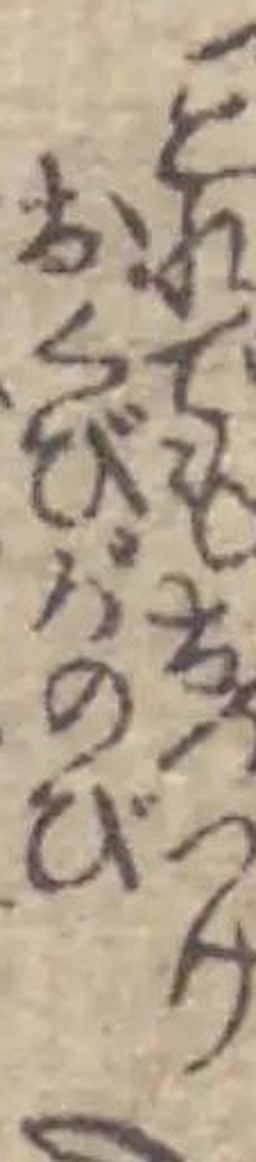おくびがのび
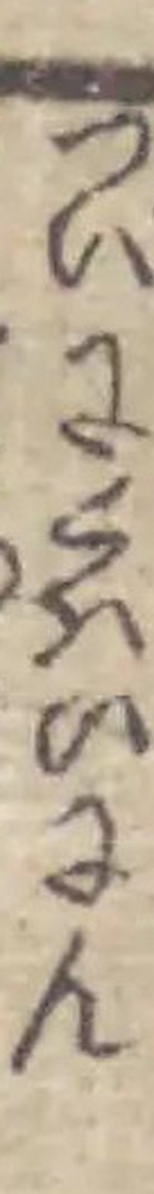ついにくはいにん
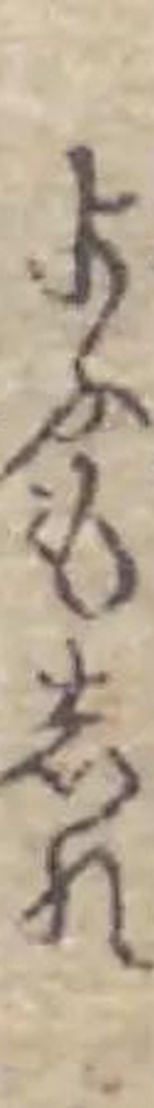よふもしれ
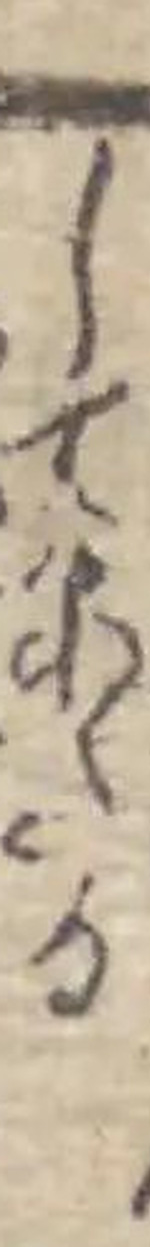してあたる
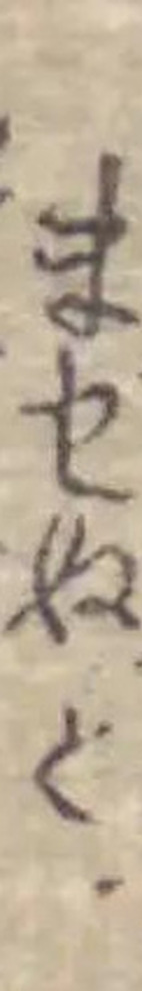ませぬと
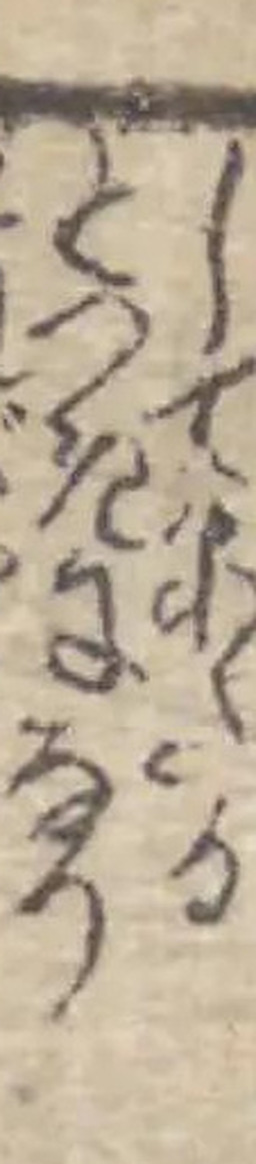とつきになり
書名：化物尽 4巻
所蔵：国立国会図書館 National Diet Library, JAPAN
